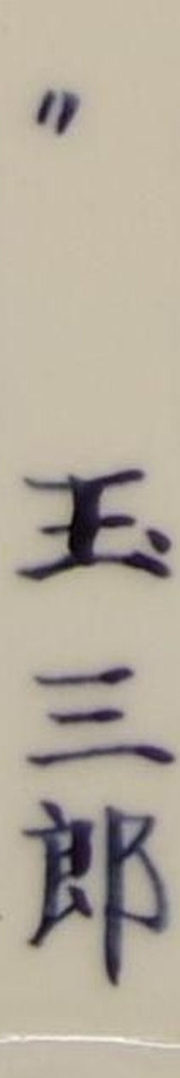玉三郎
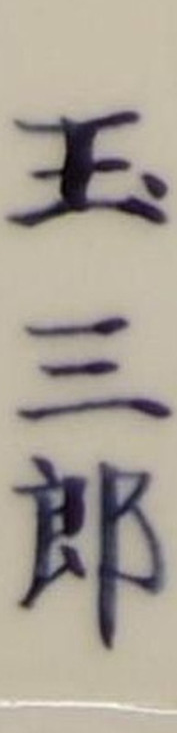玉三郎
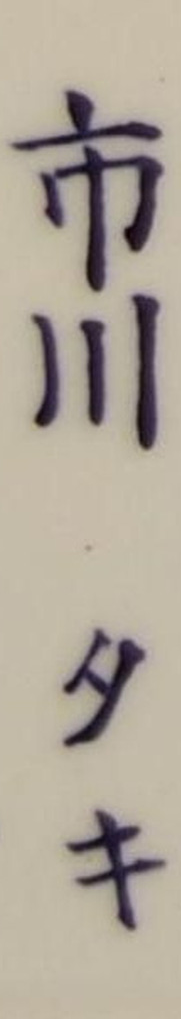市川タキ

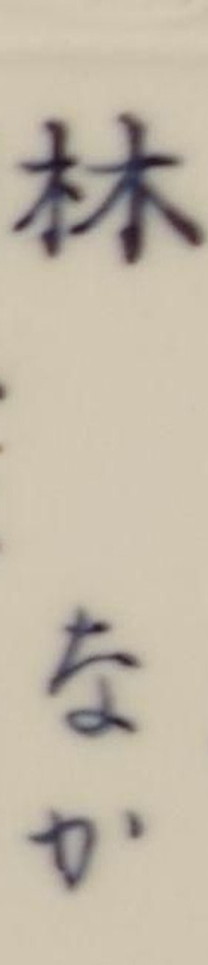林なか
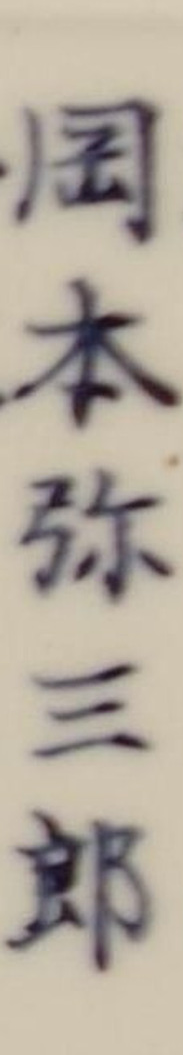岡本弥三郎
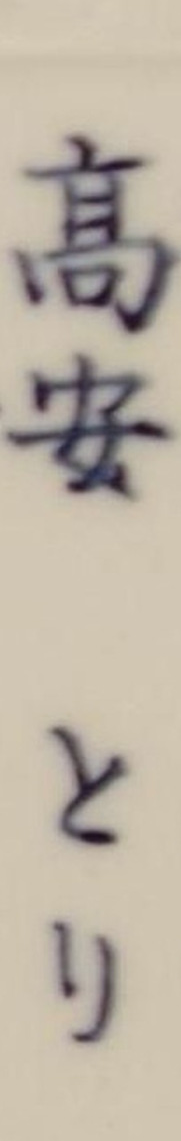高安とり
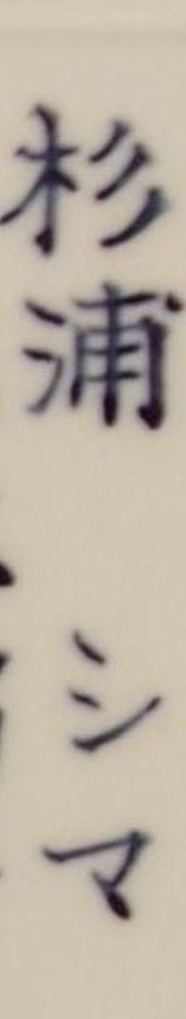杉浦シマ
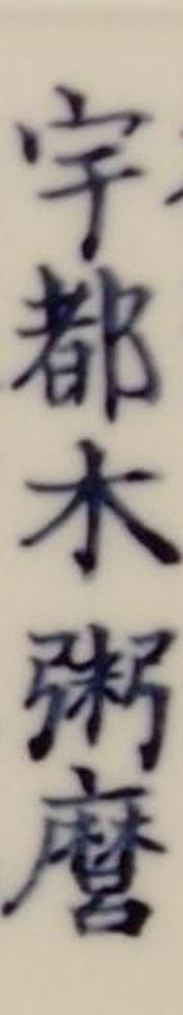宇都木粥麿
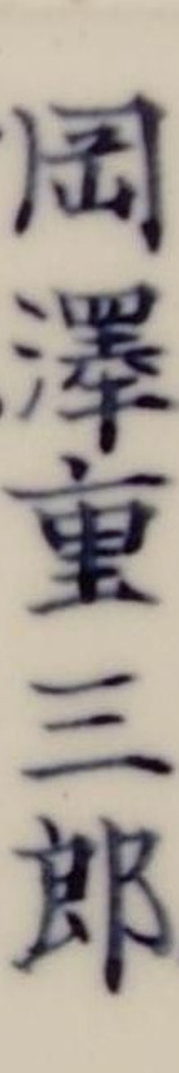岡澤重三郎
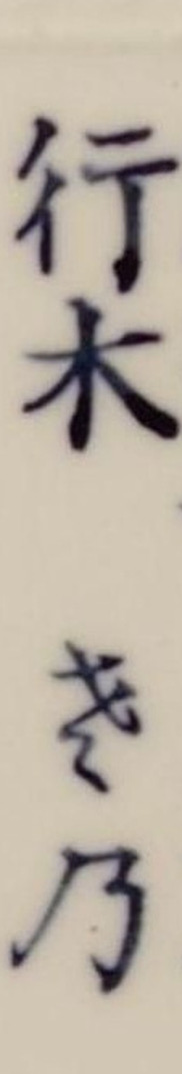行木さの
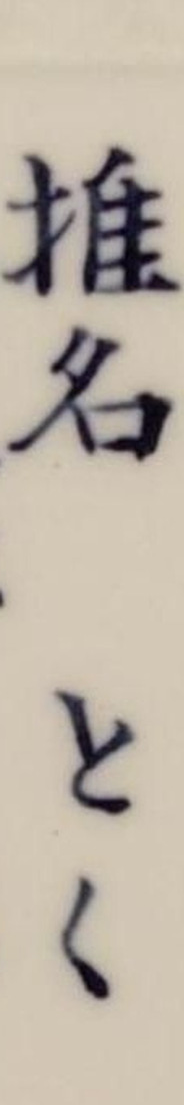椎名とく
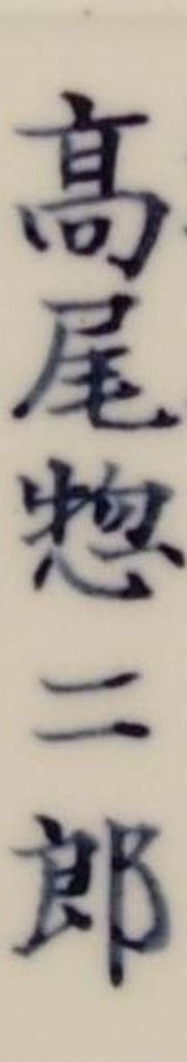高尾惣二郎
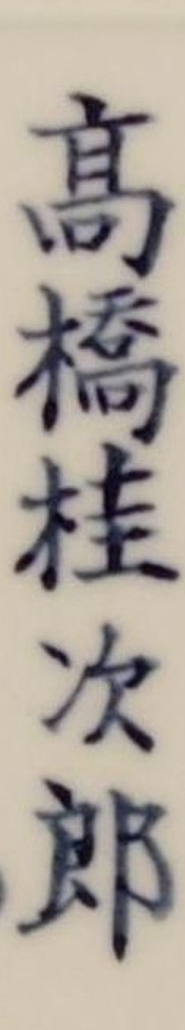高橋桂次郎
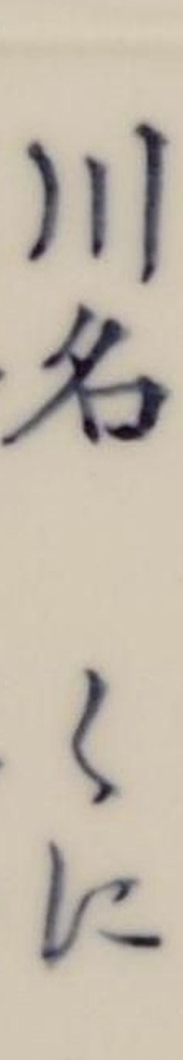川名くに
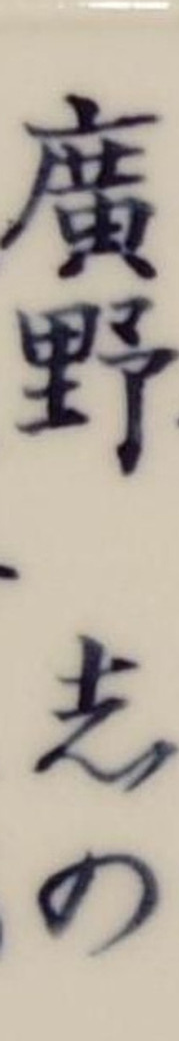廣野しの
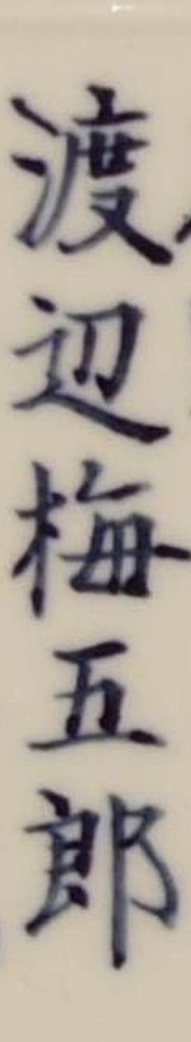渡辺梅五郎
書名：M~S
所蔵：高野山金剛峯寺
